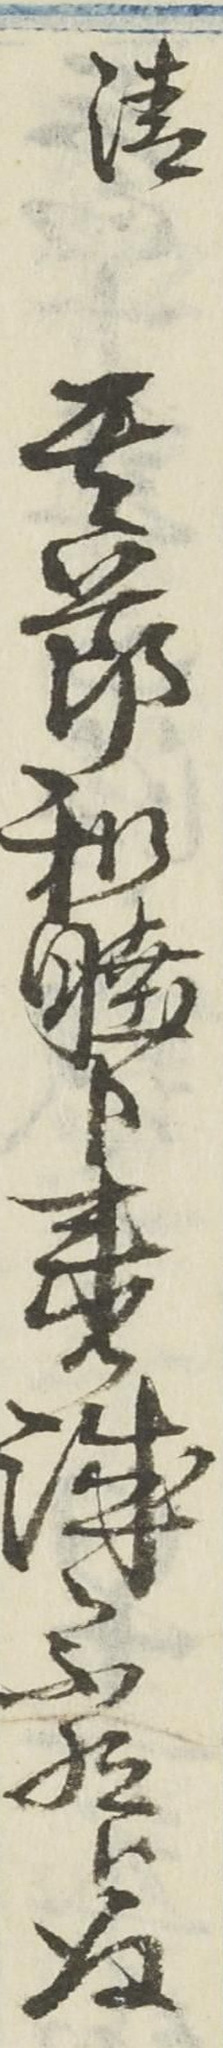清其節和睦申来ル誠ニ不有ト存
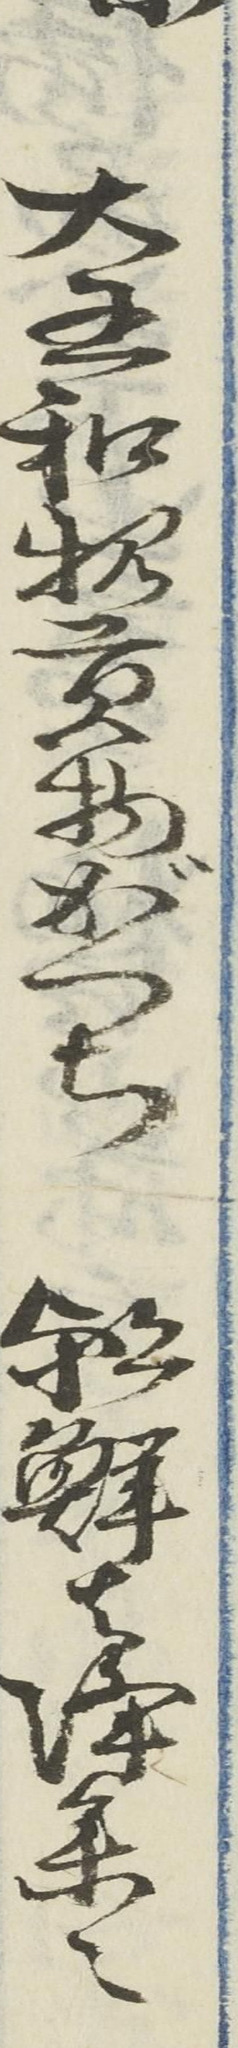小大王和親貢物がつち朝鮮は降参也
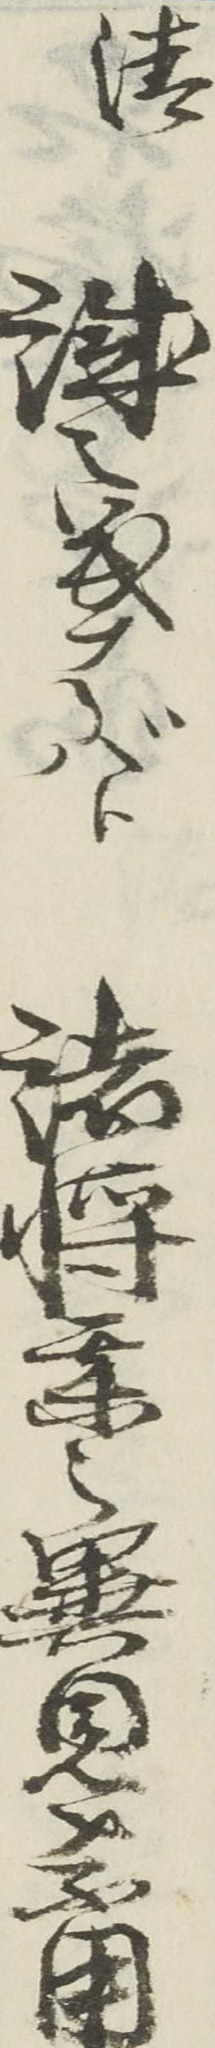清誠ニ義ナラバト諸将某之異見ヲ不用
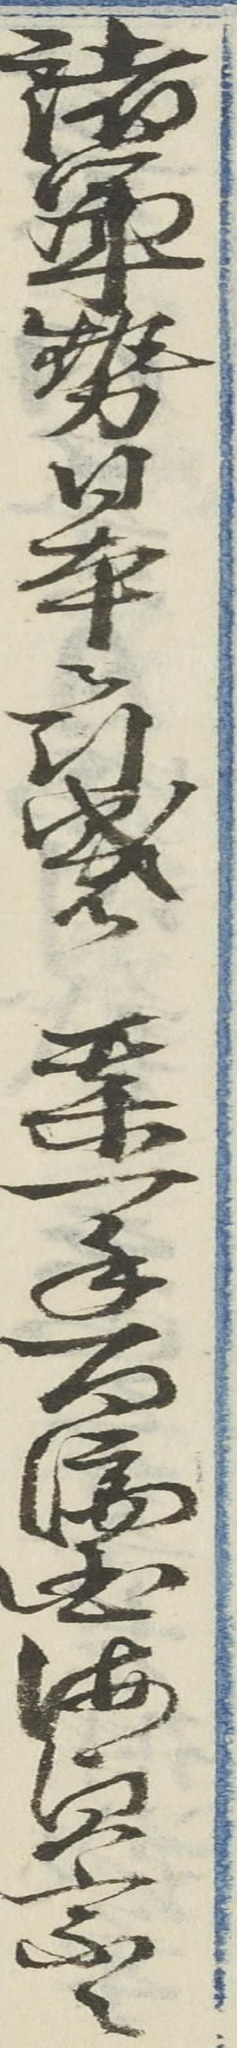諸軍勢日本ニ引閉ル某一手百済国海貞宗ニ
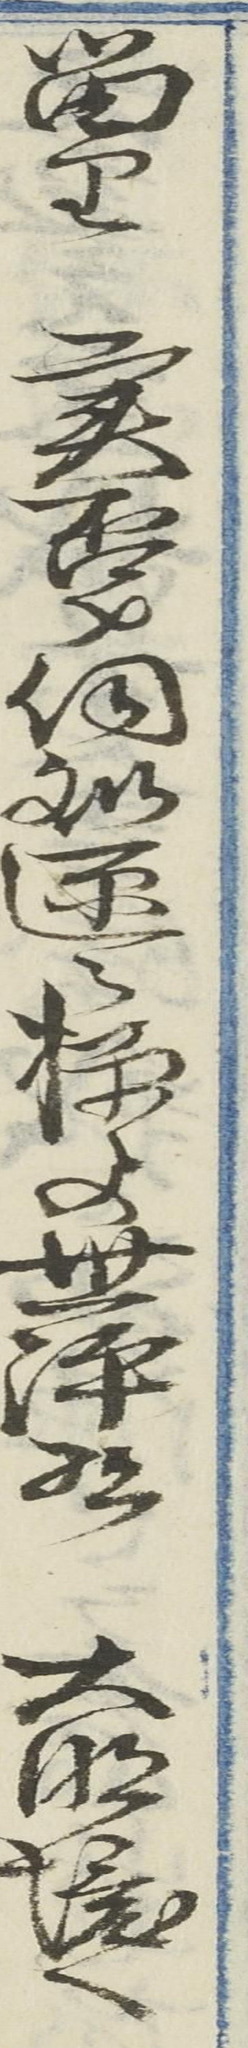留り実否ヲ伺処還之様子世評有大明境ヘ
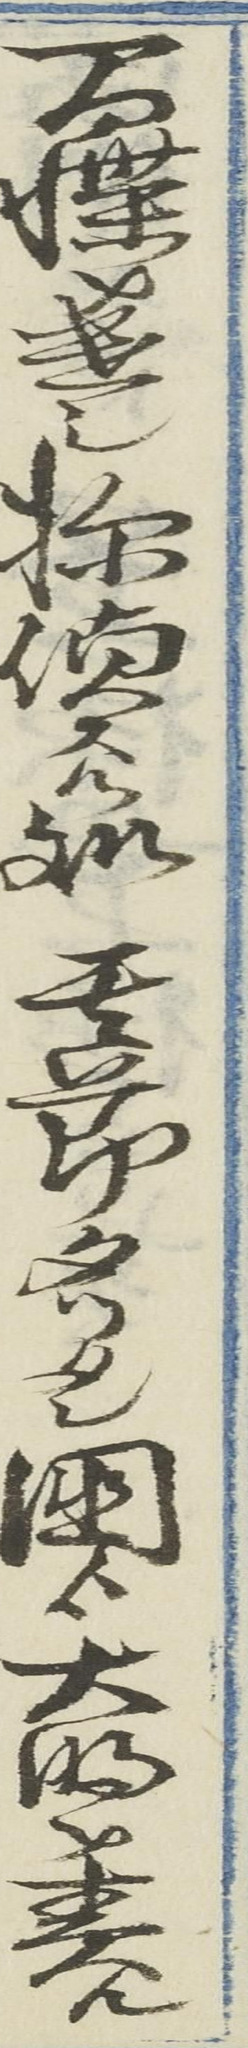間諜ヲ遺シ探偵スル処其節タツタン国ゟ大明ヲ責ル
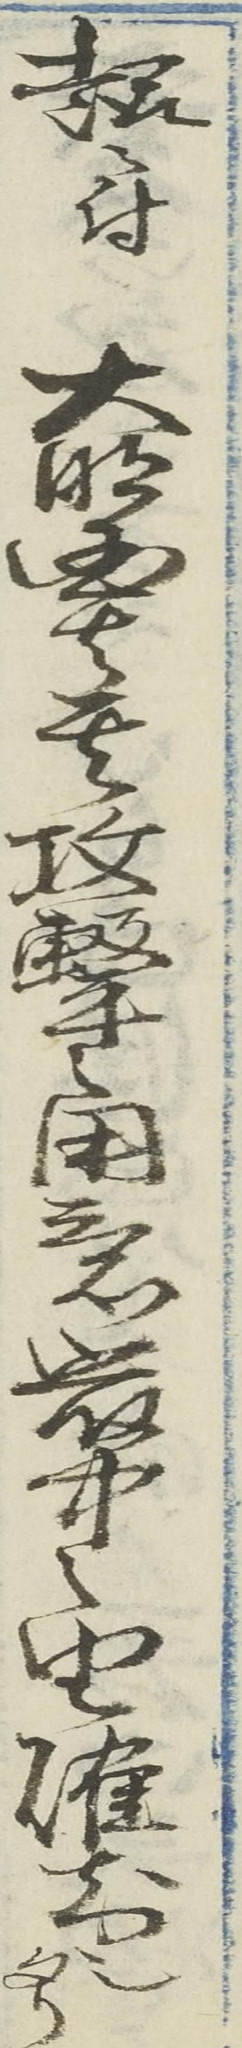趣ニ付大明国は其攻撃之用意最中之由確知シタリ
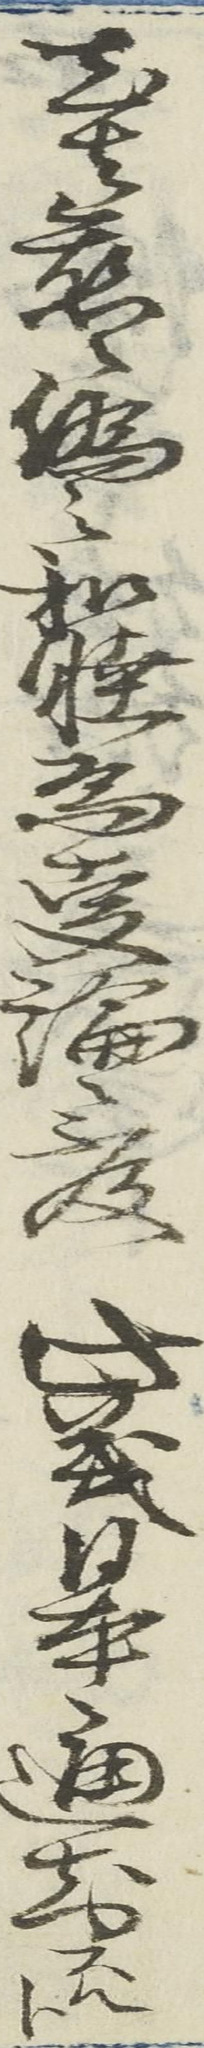至は燕ニ偽之和睦為事論ニ不及此義日本ニ通知スルト
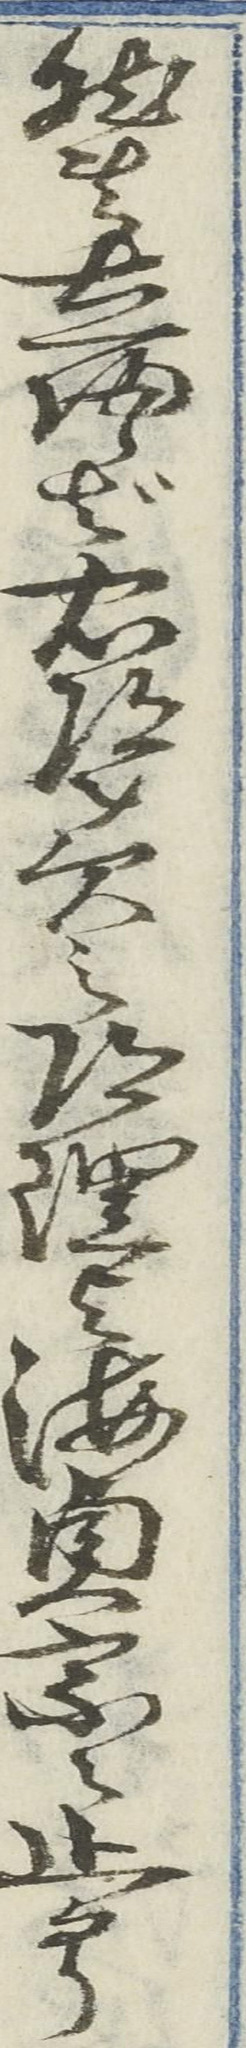然共立帰ば忠道ヲ欠之道理と海貞宗ニ止タリ
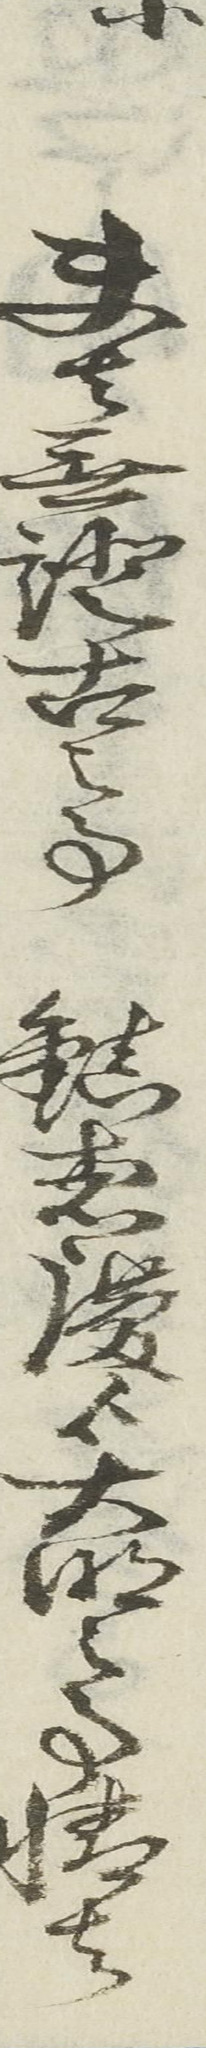小夫ハ無證古之事鎮恵慶ゟ大明之事情は
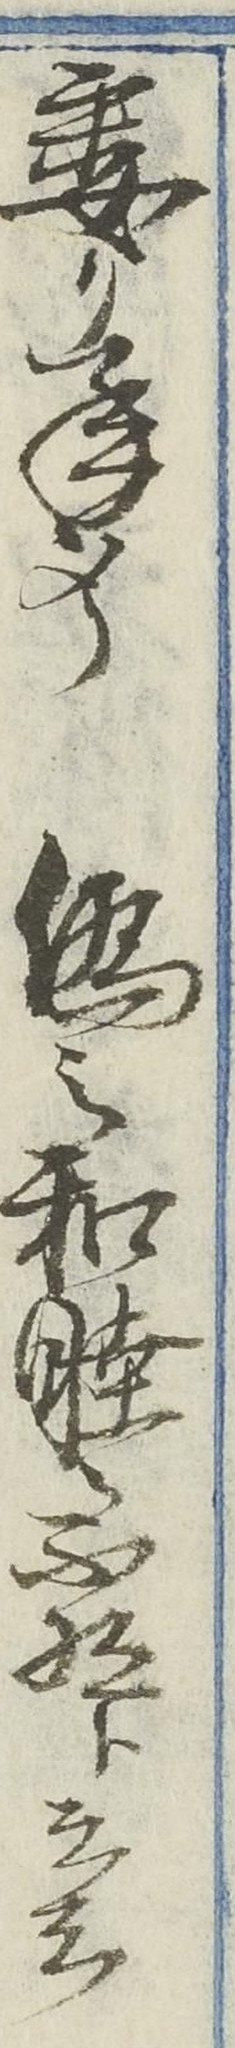委ク承タリ偽之和睦ニ不有ト云云
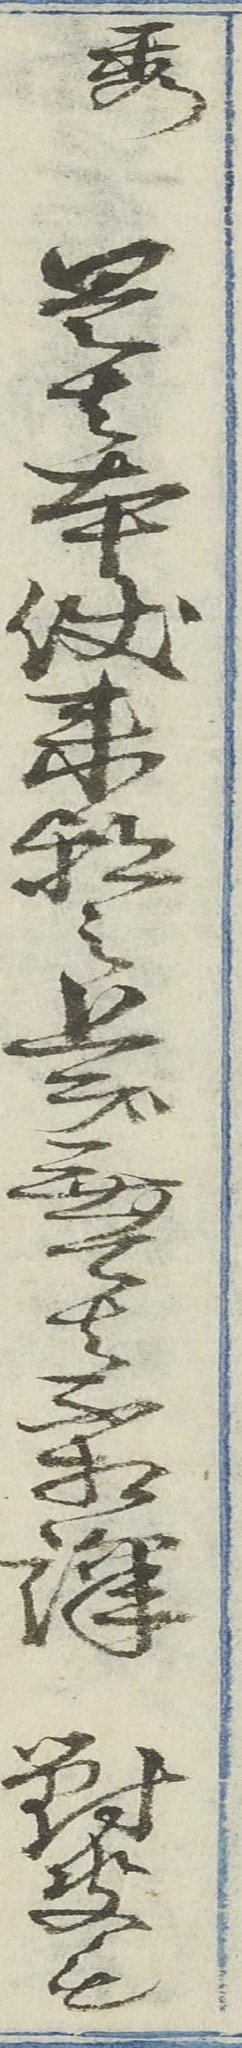秀是は本使来朝之上デ無ては不相訳対決も
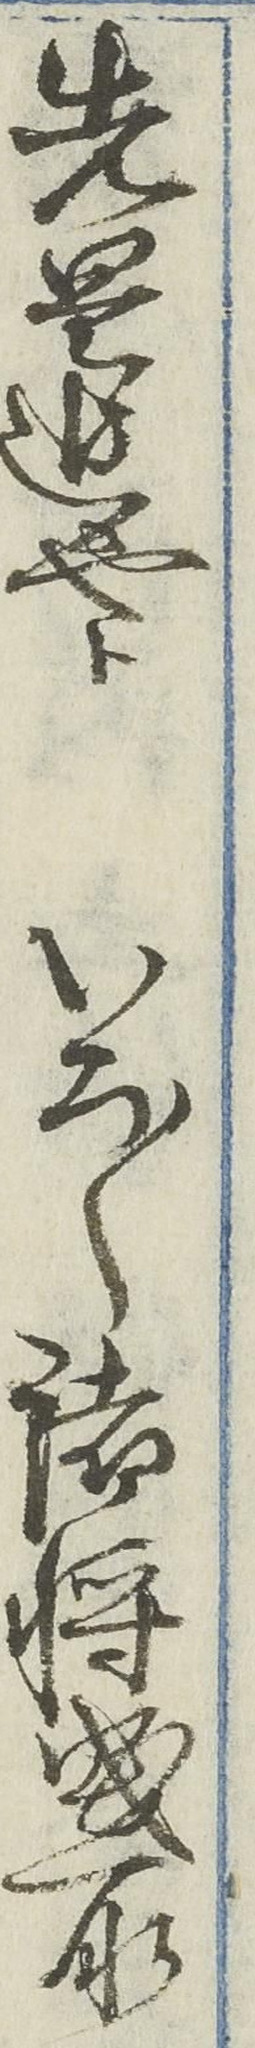先是迄也トいろ〳〵諸将曳取
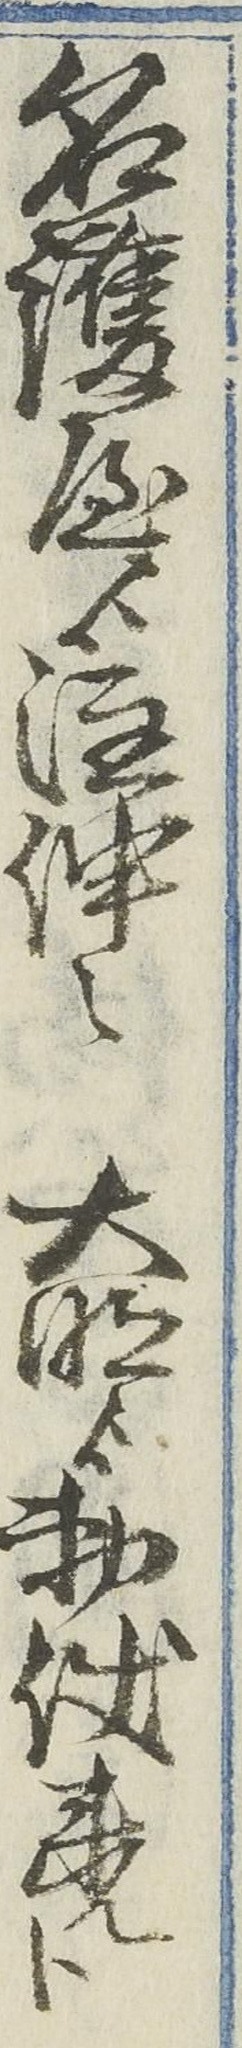名護屋ゟ注伸シ大明ゟ勅使来ルト
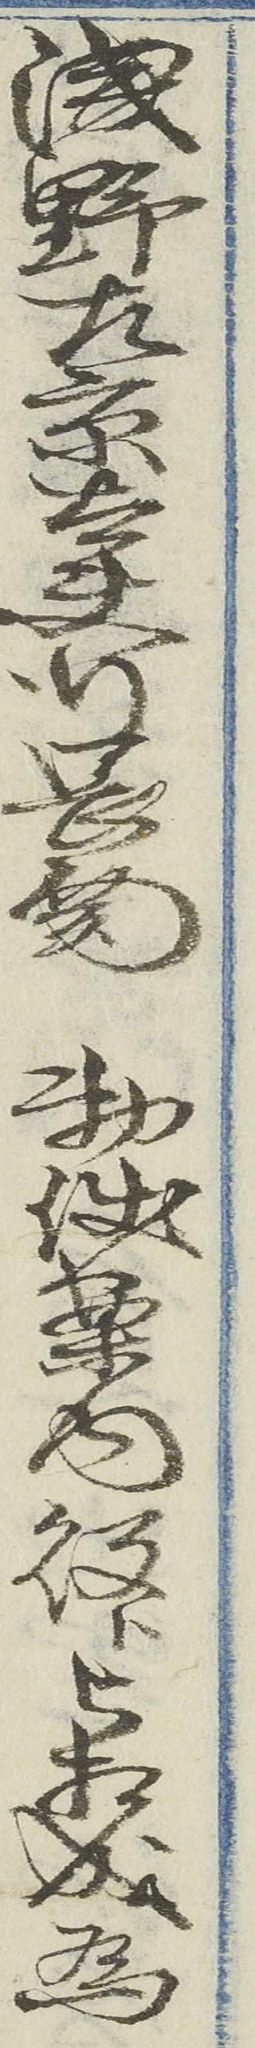浅野左京太夫行長殿勅使案内役ト被相成為
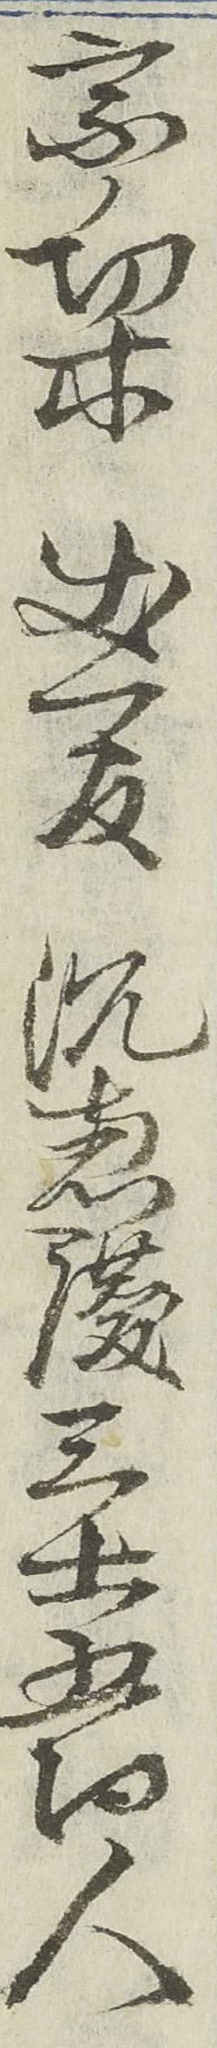宗ノ切木丈一友況恵慶三士五百人
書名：伏水大地震
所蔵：東京大学地震研究所図書室 Earthquake Research Institute Library, The University of Tokyo, JAPAN
